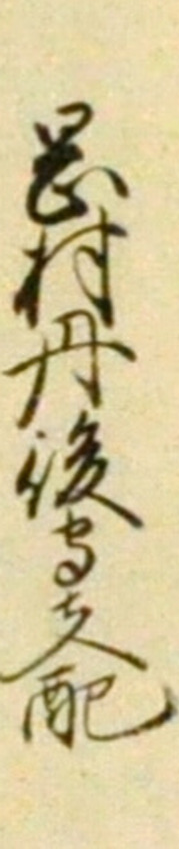岡村丹後守支配
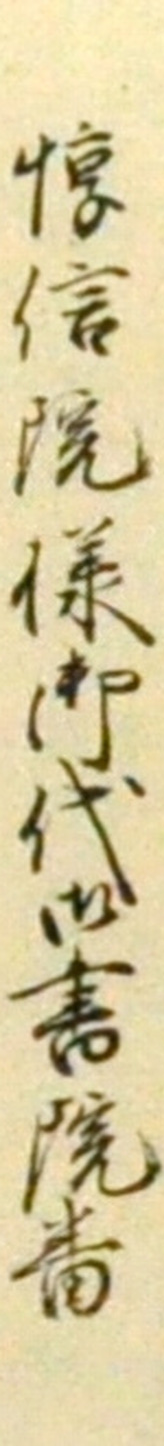惇信院様御代御書院番
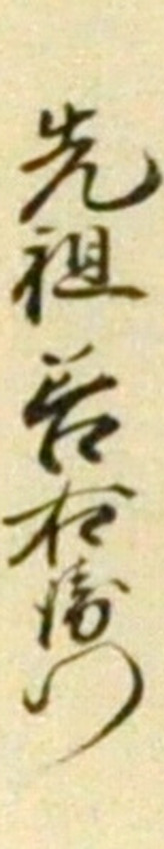先祖善右衛門
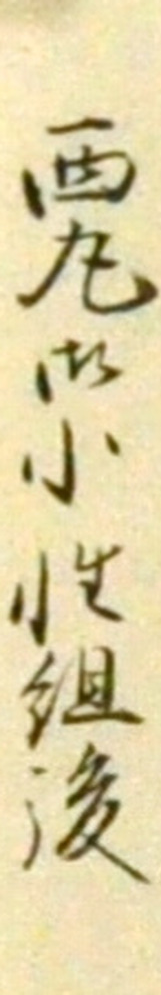西丸御小姓組後

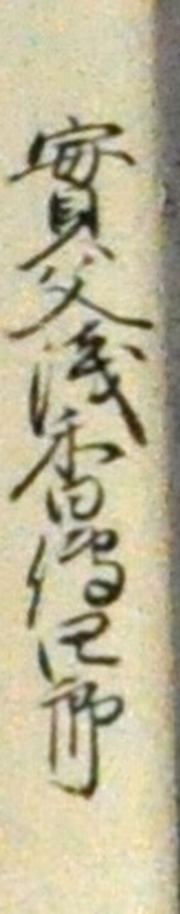実父浅香傳四郎
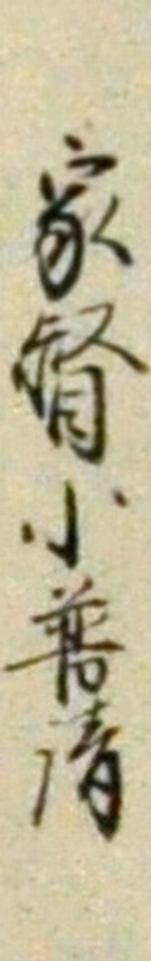家督小普請
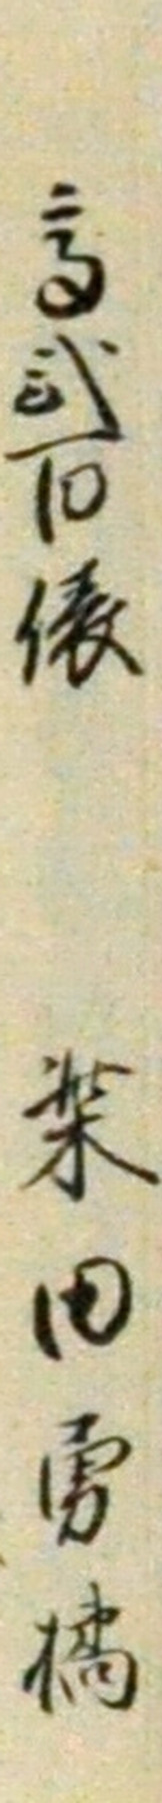高弐百俵柴田勇橘
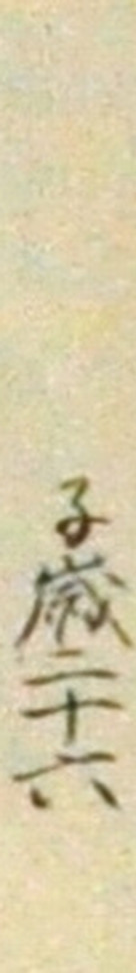子歳二十六
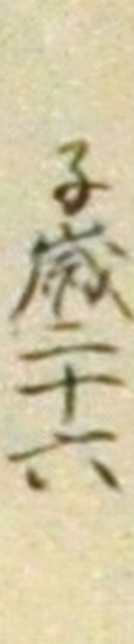子歳二十六
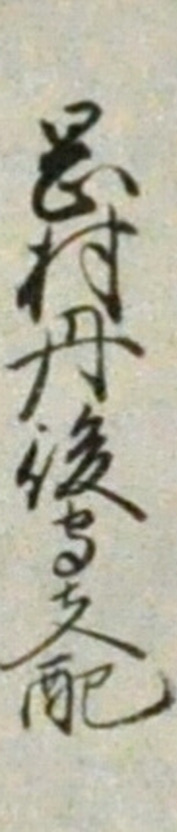岡村丹後守支配
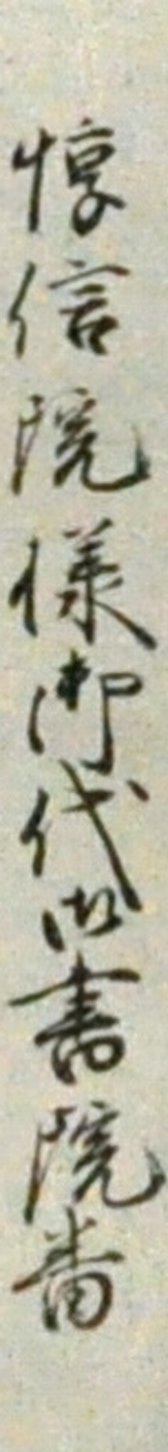惇信院様御代御書院番
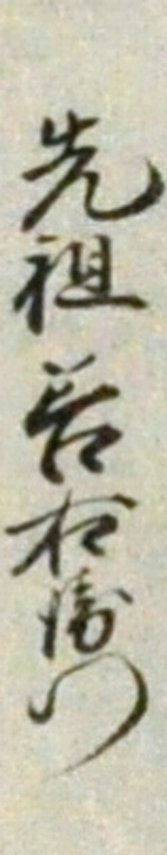先祖善右衛門
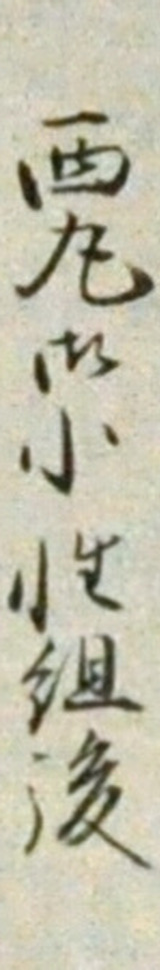西丸御小姓組後
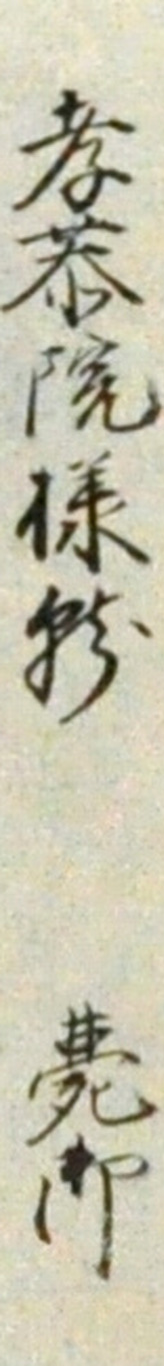孝恭院様就薨御
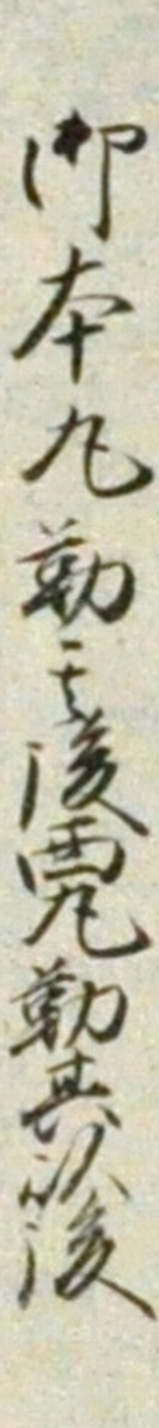御本丸勤其後西丸勤其以後
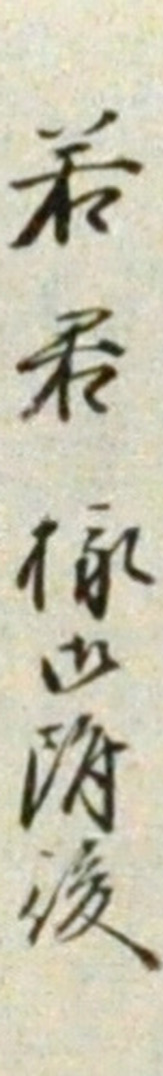若君様御附後
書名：若年寄御役中御調書付
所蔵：伊那市立高遠町図書館・合同会社AMANE
